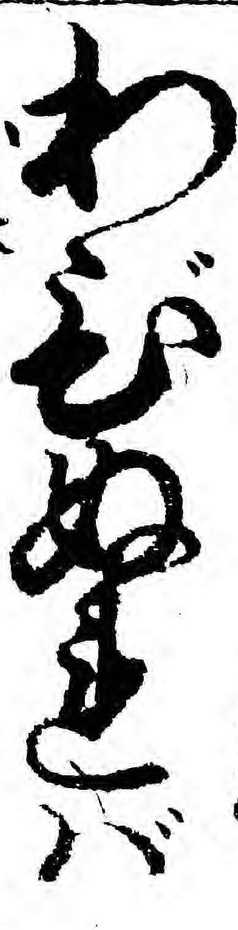わびぬれば
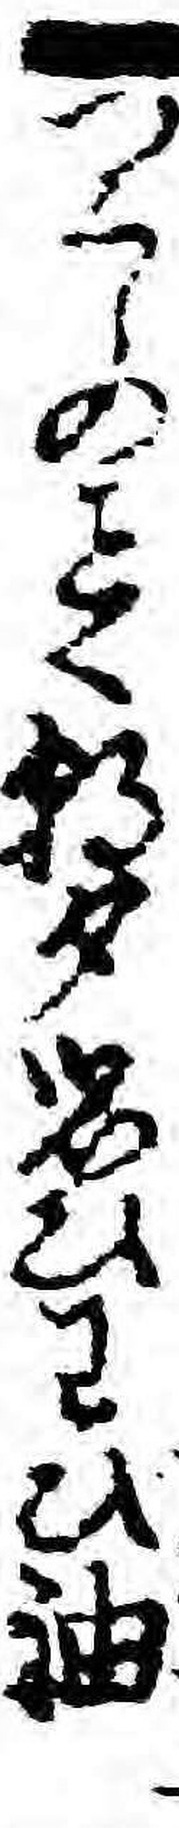づくしのことく朝夕思ひわび袖
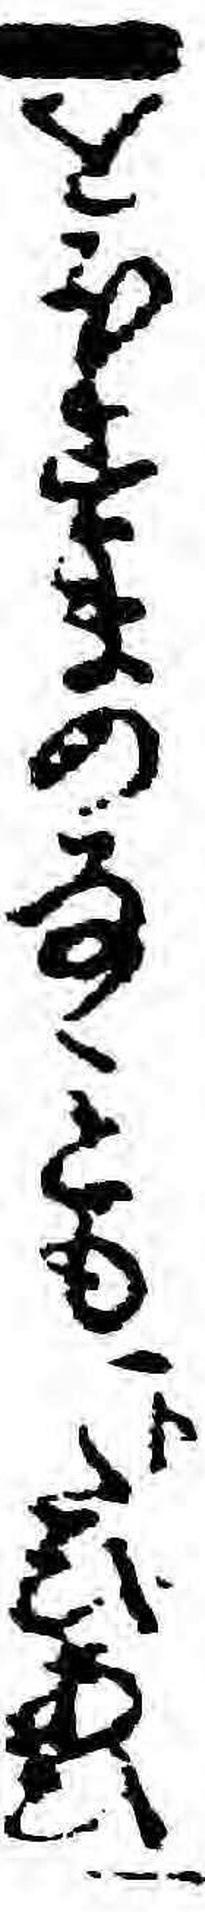をほすまのなくとも一トたびあひ
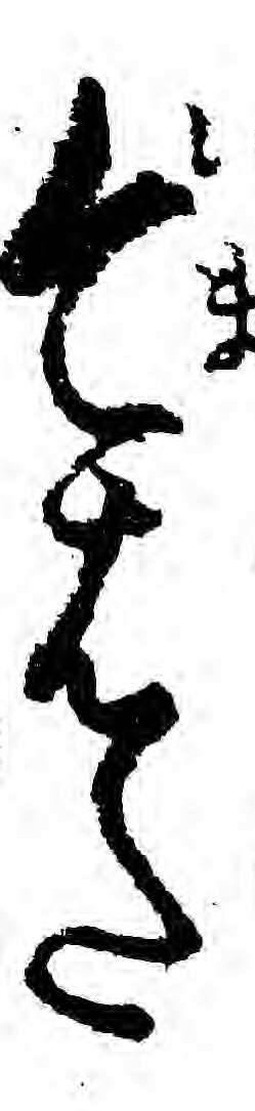今はた
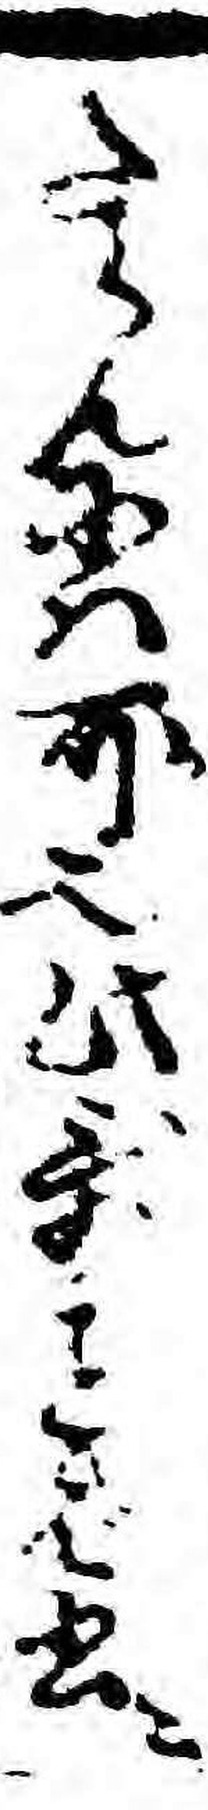たらんには可也此哥ことば書に
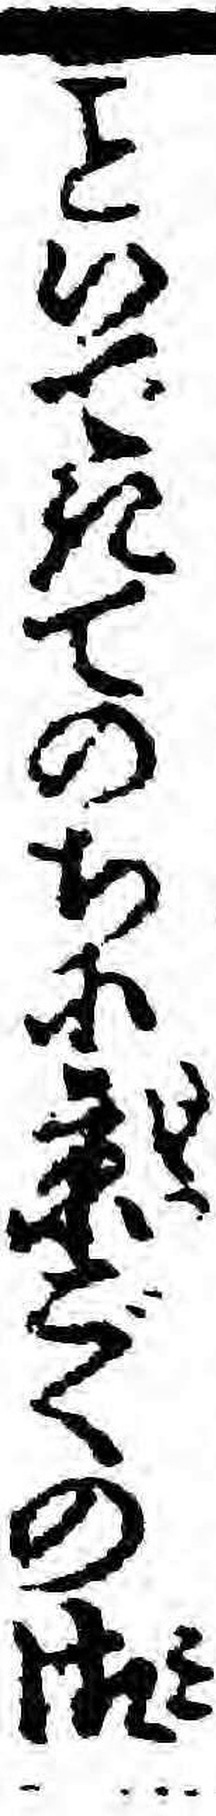こといできてのちに京ごくの御
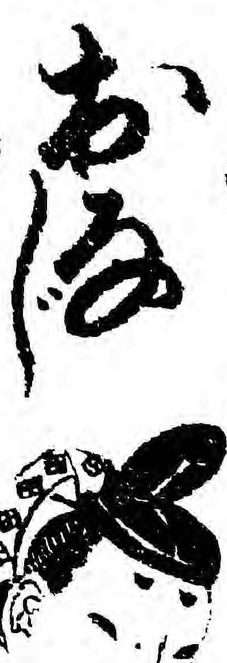おなじ
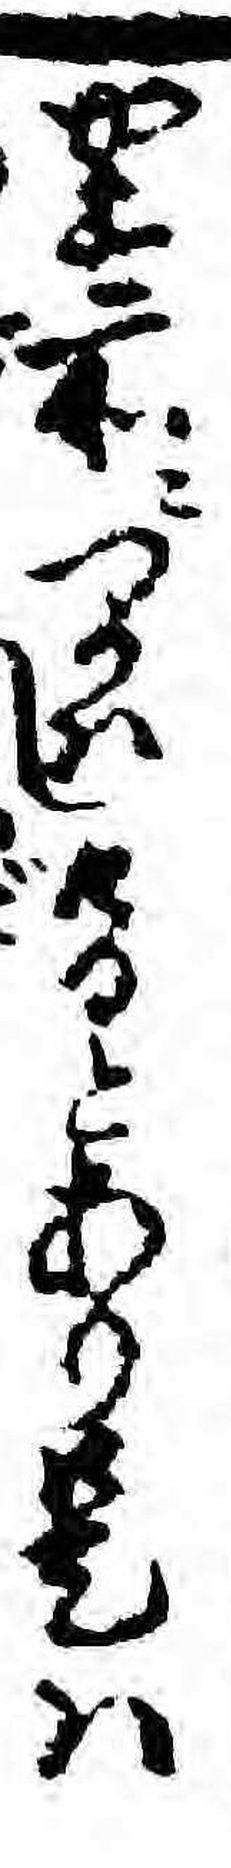やす所につかはしけるとあり是は
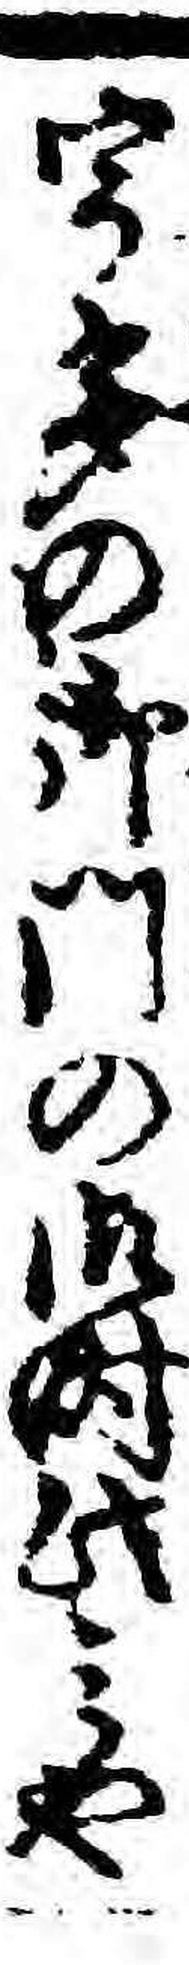宇田の御門の御時此みや
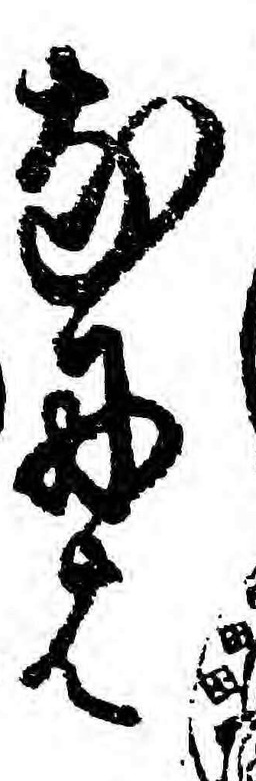なには
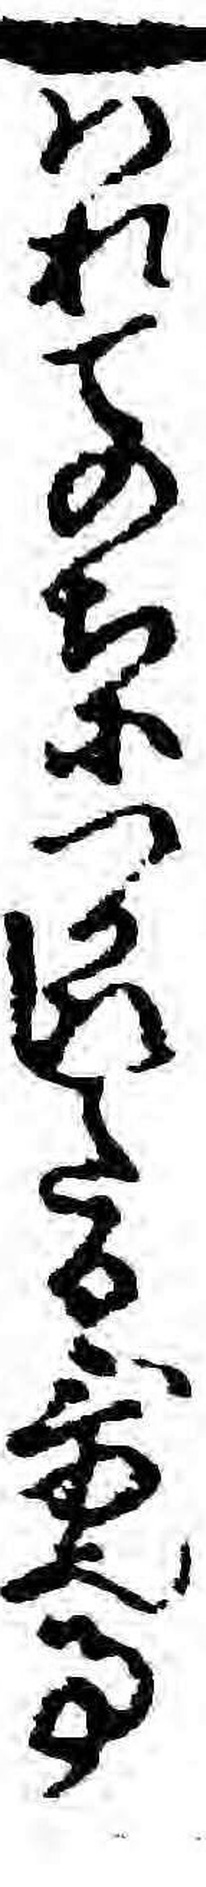はれてのちにつかはしたる哥也事
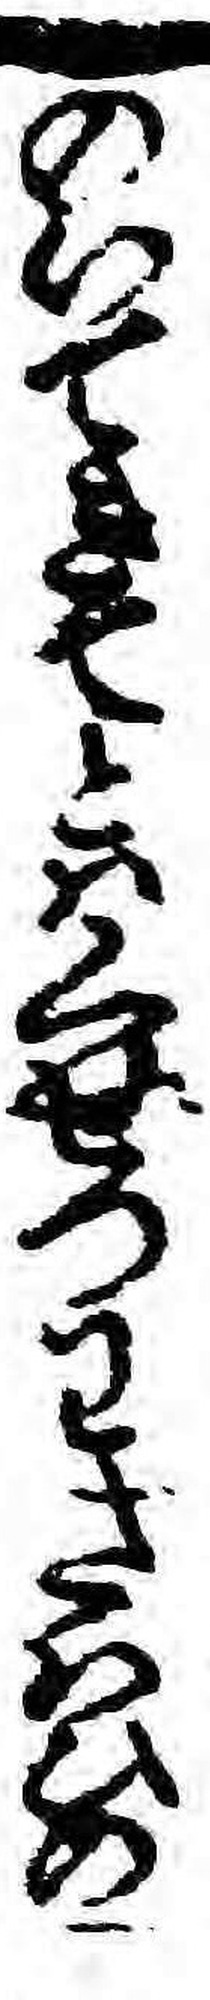のいてきてとはくぜつわざはひの
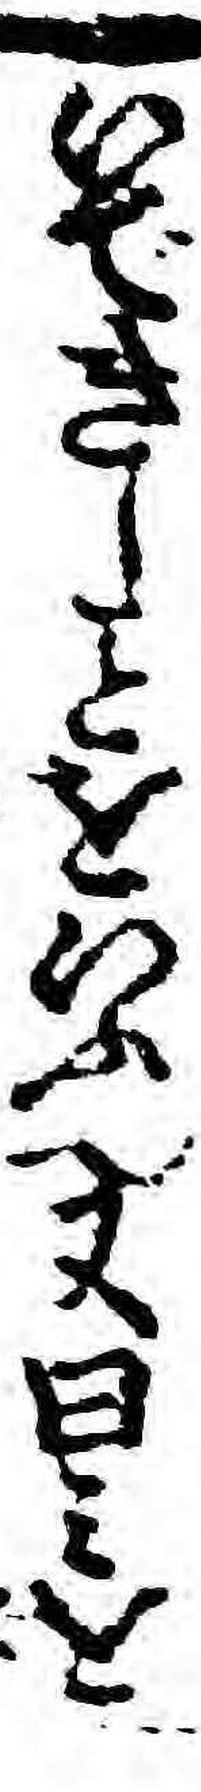いできしことをいふ也又曰みを
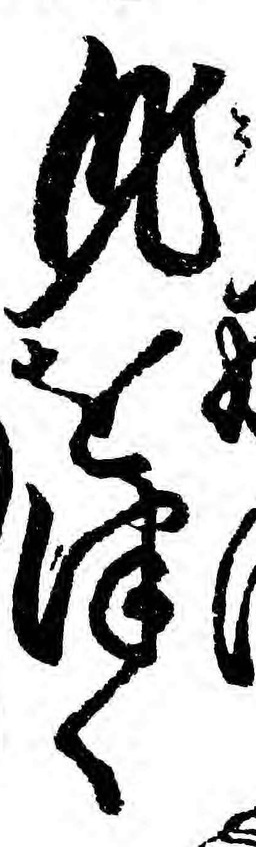身をつく
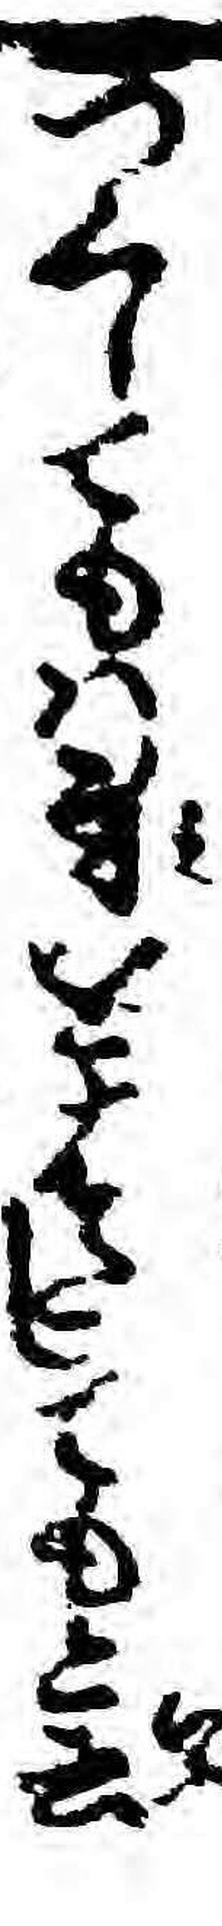つくしてもは身をはたしてもと云
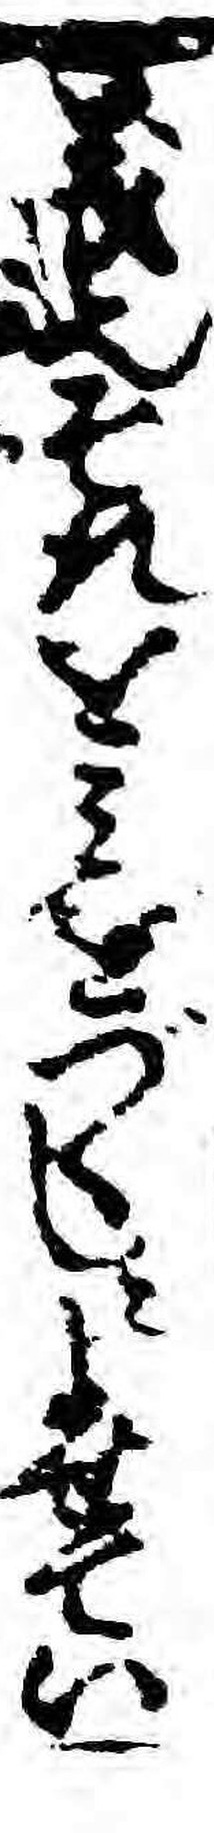義也それをみをづくしによせてい
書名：頭書和歌注譯／壽賀多百人一首小倉錦
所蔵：国文学研究資料館
